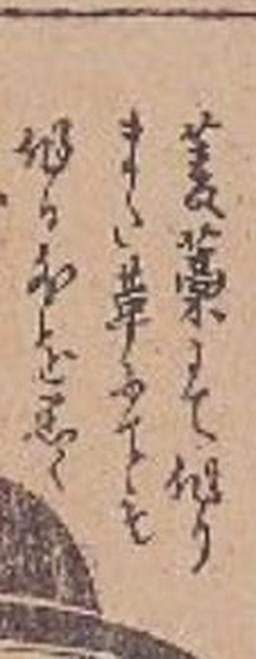また革にても
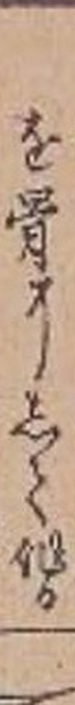を骨にして作る
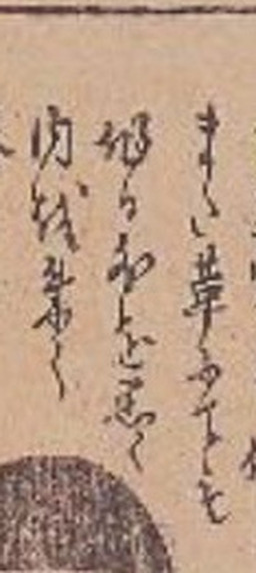つくる外を黒く
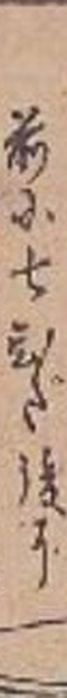前に七ひだ後に
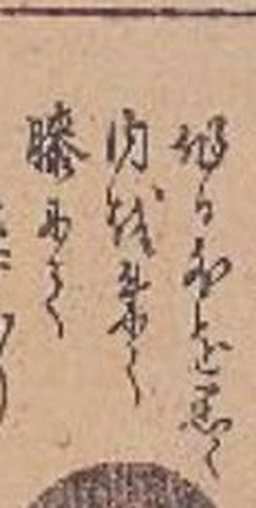内を朱く
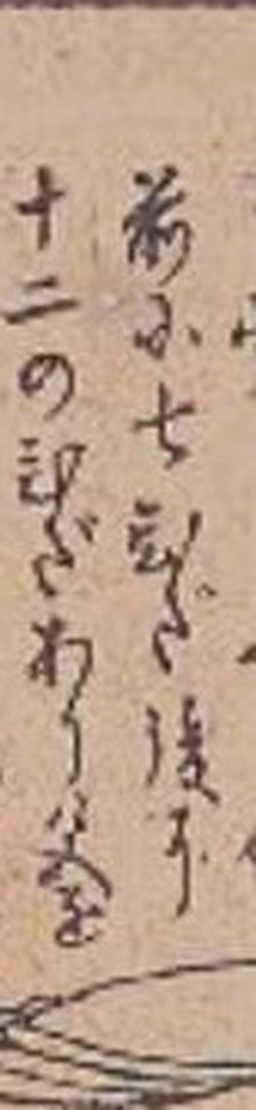十二のひだあり色を
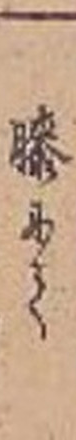漆にて
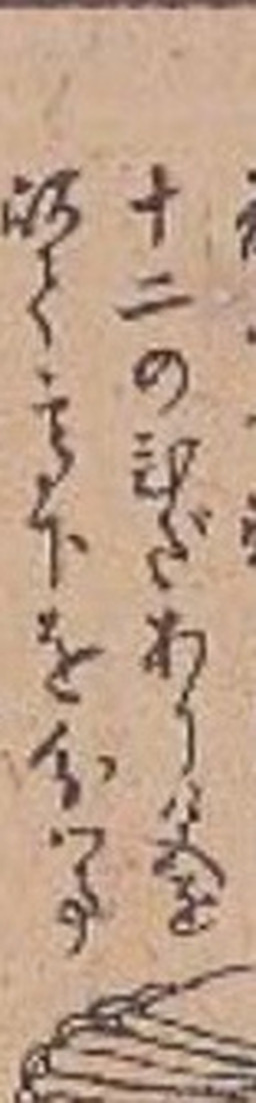以て高下を分つ事
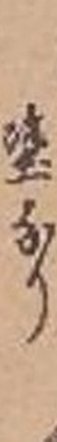塗なり
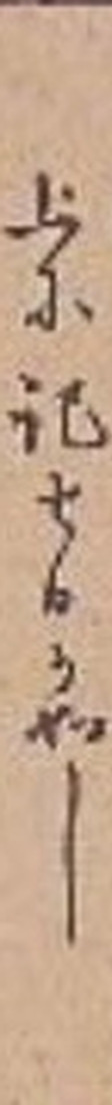上に記せるか如し
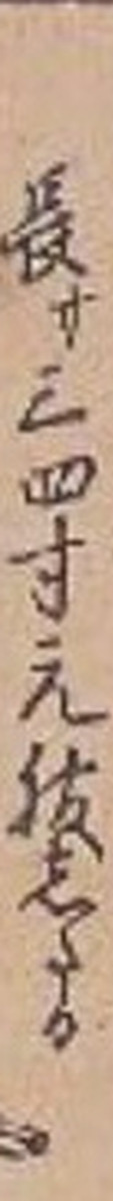長さ三四寸元服したる
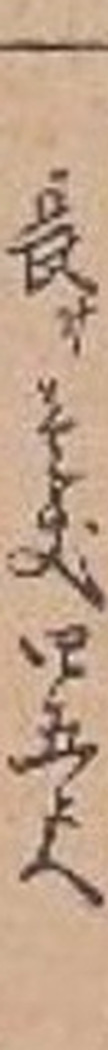長さ一丈四五尺
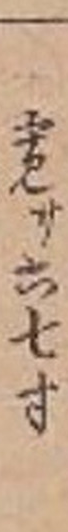寛さ六七寸
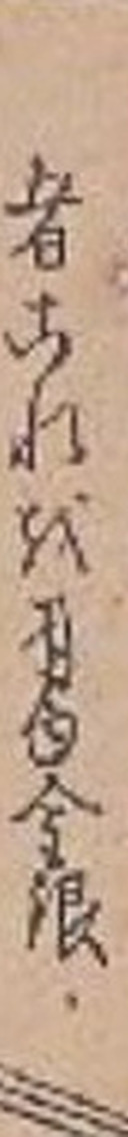者これを用ゆ金銀
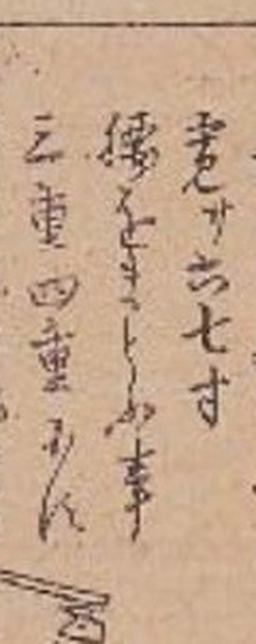腰をまとふ事
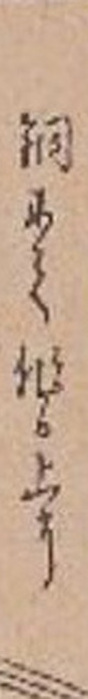同にて作る上に
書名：琉球談
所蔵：University of the Ryukyus Library
